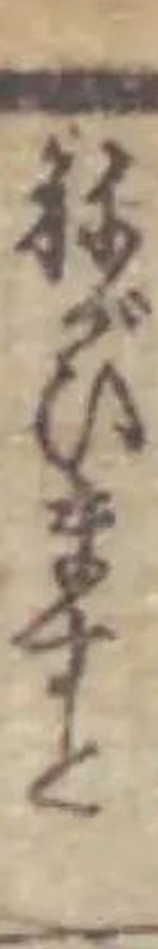ねがひますと
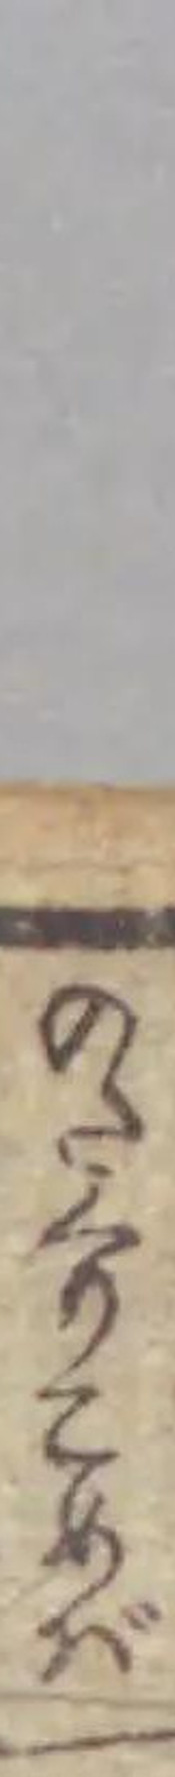のたくりこめば
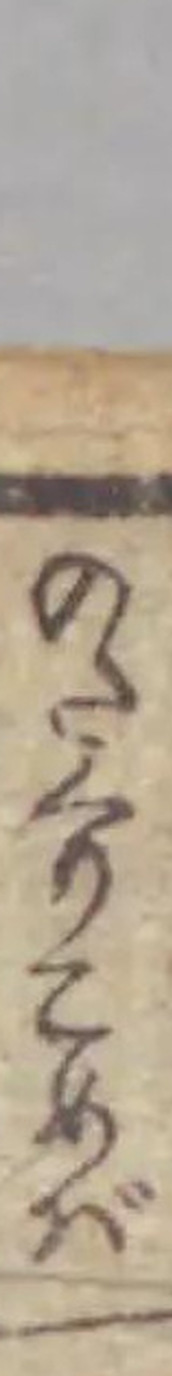のたくりこめば
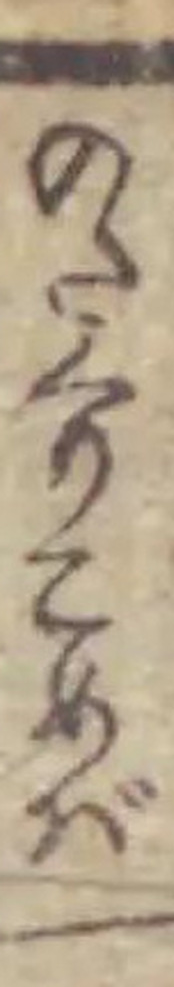のたくりこめば
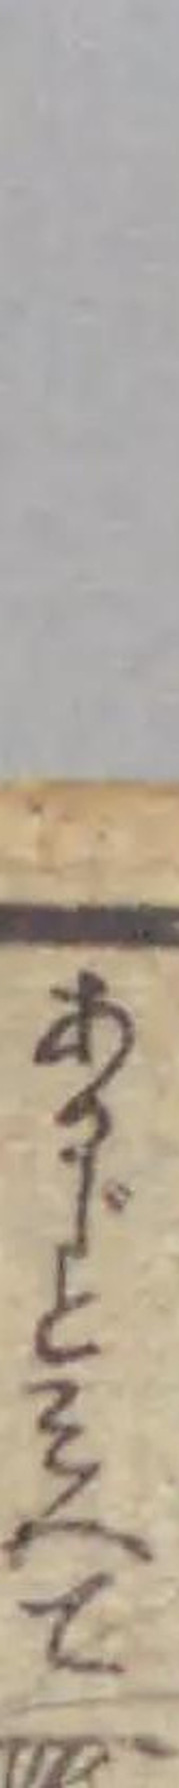あるじとみへて
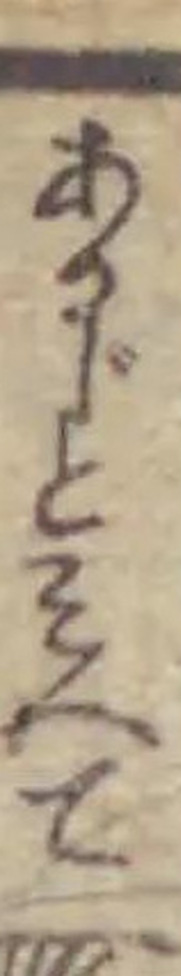あるじとみへて
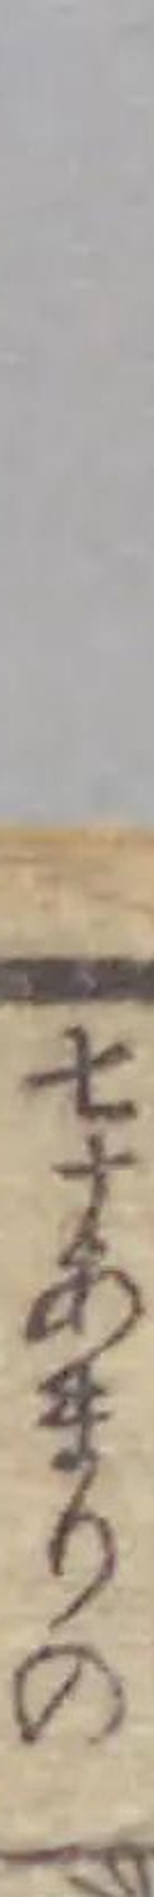七十あまりの
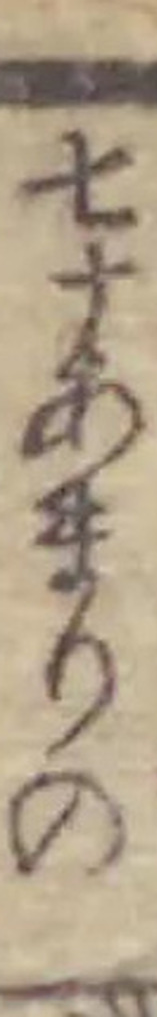七十あまりの
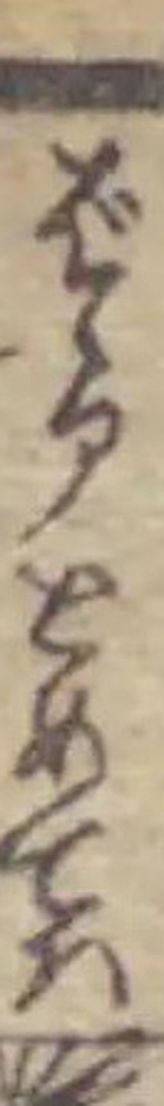ばゝアとめては
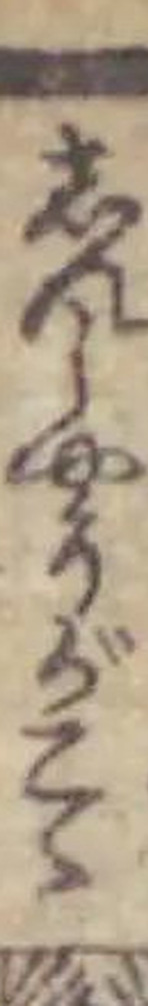しんじやうがこゝ
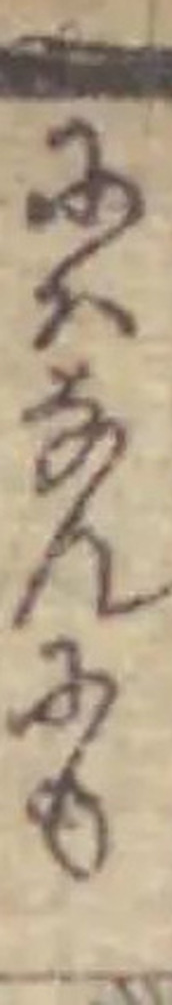にはなんにも
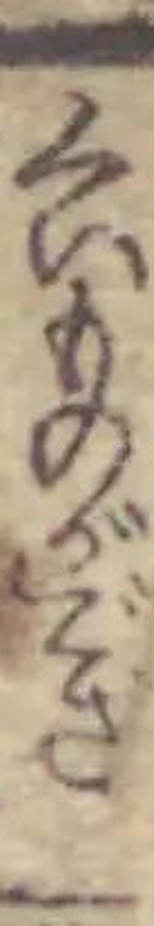くいものがござ
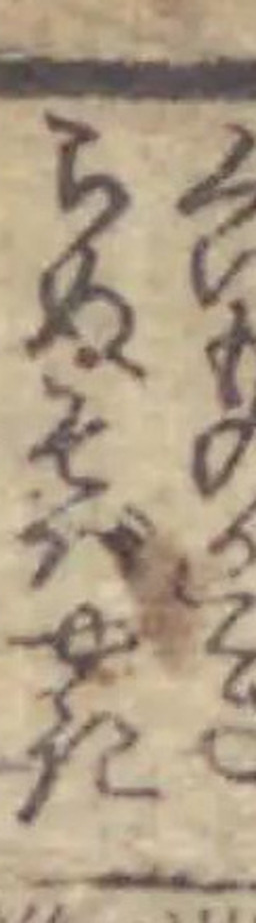らぬそばやき
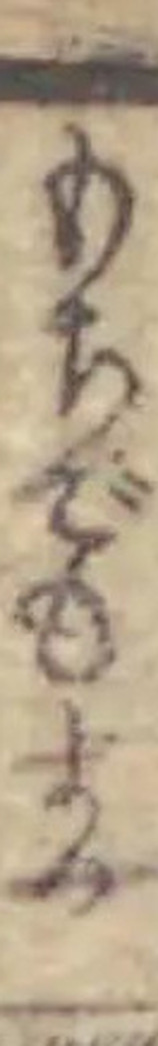もちでもよか
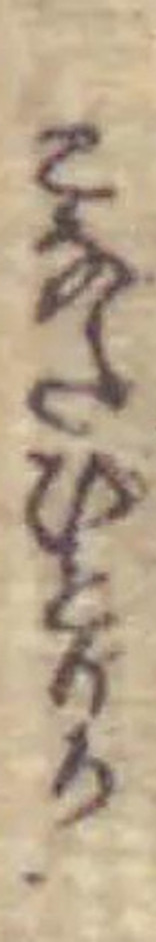こなたひとりか
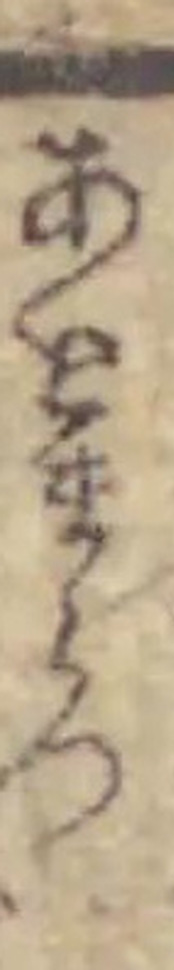あとまらつ
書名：もふもふもふ怖噺 2巻
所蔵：国立国会図書館 National Diet Library, JAPAN
